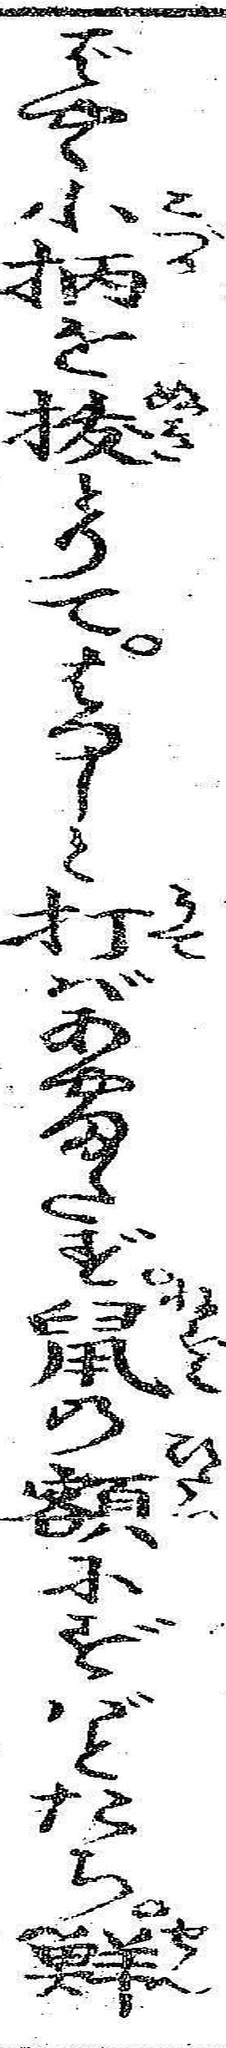ばやく小柄を抜とりて。はつしと打ばあやまたず。鼠の額にずばとたち。鮮
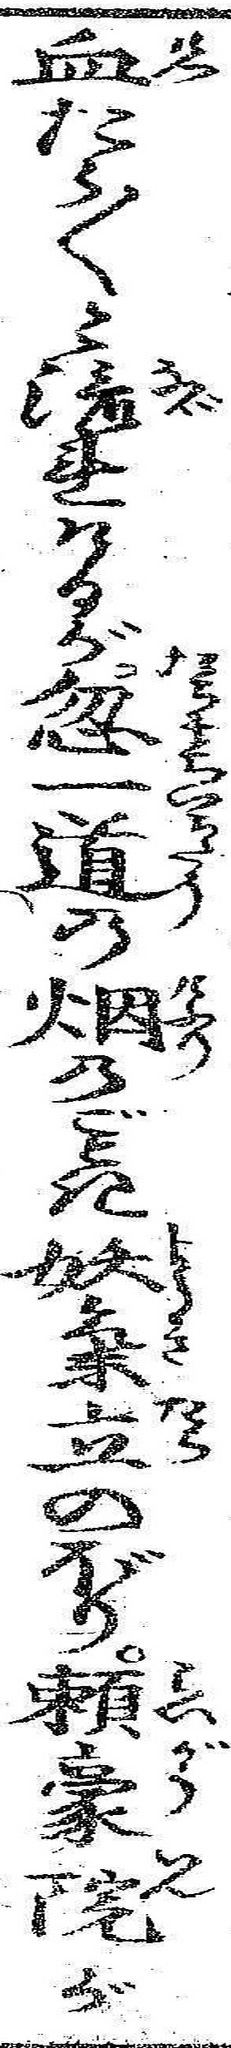血たら〳〵と流れけるが。忽一道の煙のごとき妖気立のぼり。頼豪院が
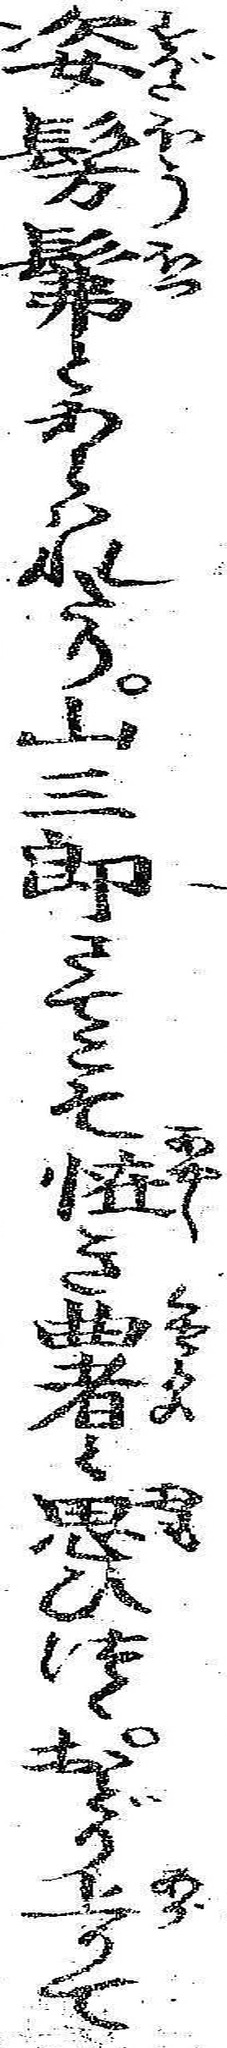姿髣髴とあらはれたり。山三郎さてこそ怪き曲者と思ひつゝ。おどり上りて
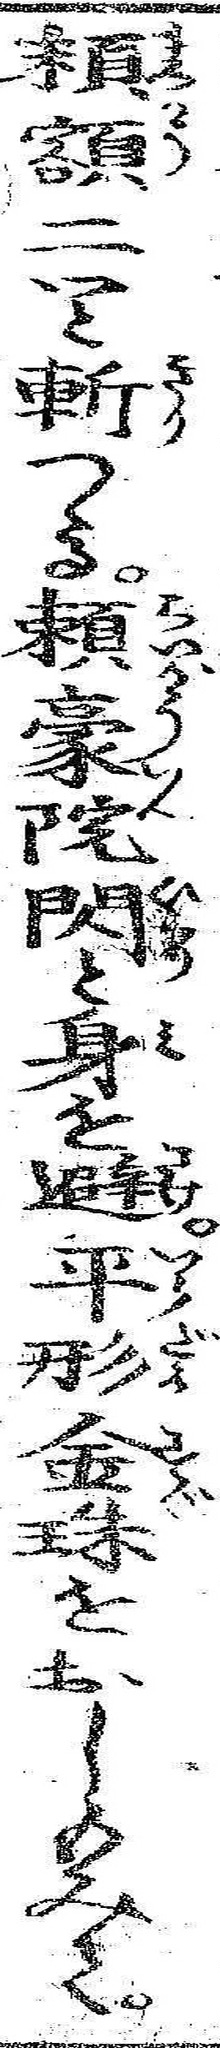頛額二つと斬つくる。頼豪院閃と身を避。平形金珠をおしもみて。

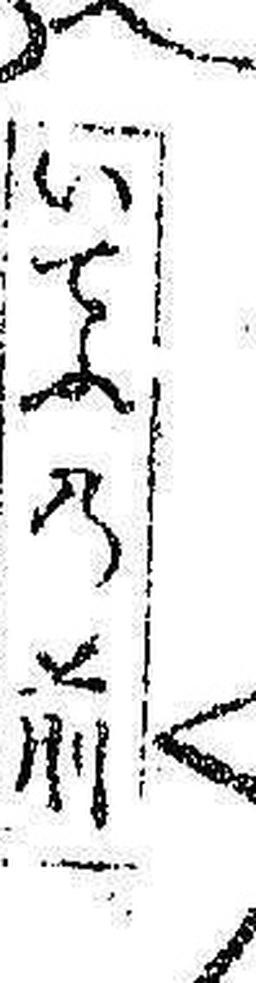いてふの前
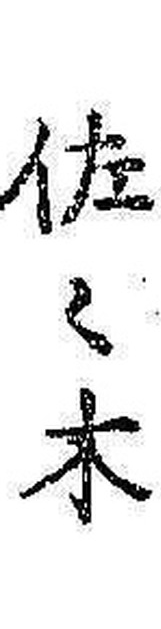佐々木
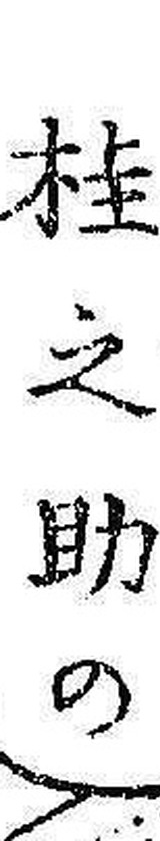桂之助の
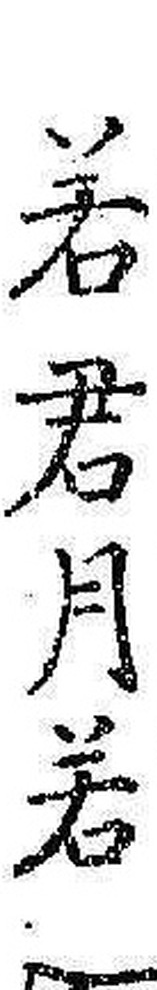若君月若
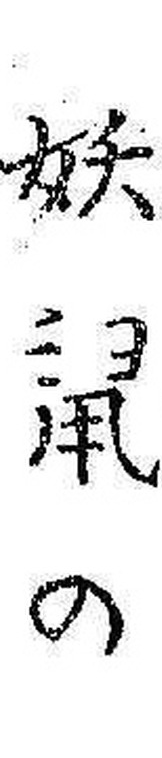妖鼠の
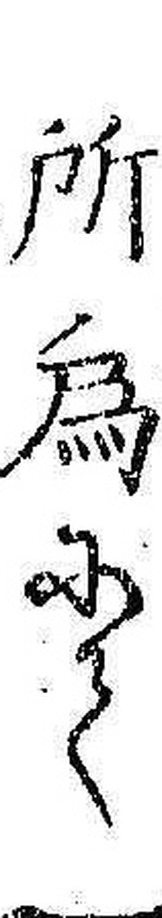所為にて
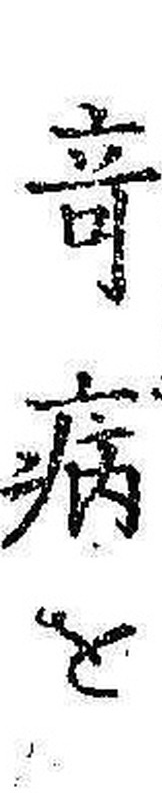奇病を
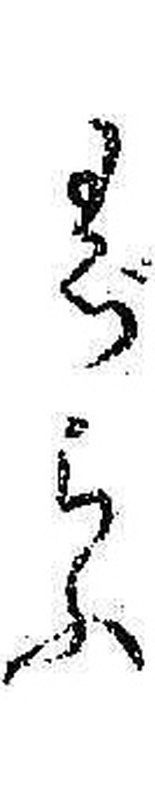わづらふ
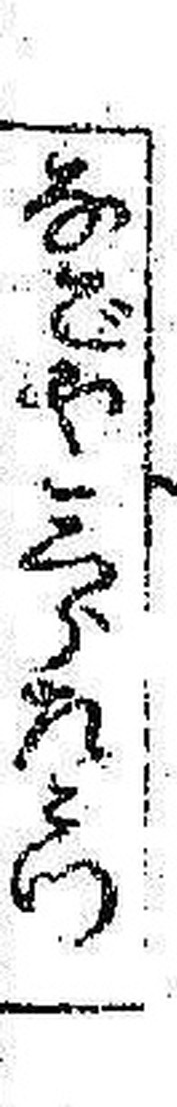なごや三郎左衛門
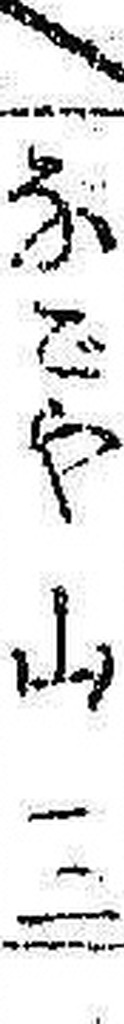なごや山三

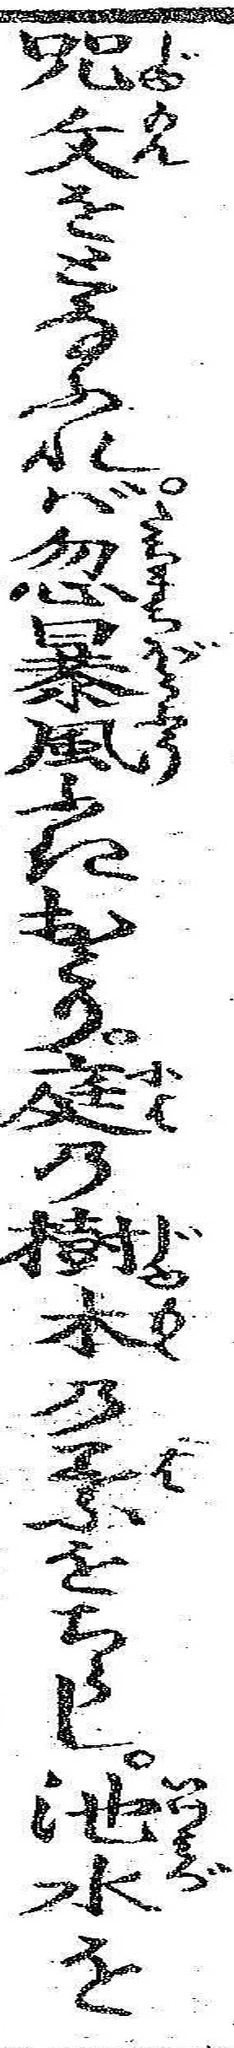呪文をとなふれば。忽暴風ふきおこり。庭の樹木の葉をちらし。池水を
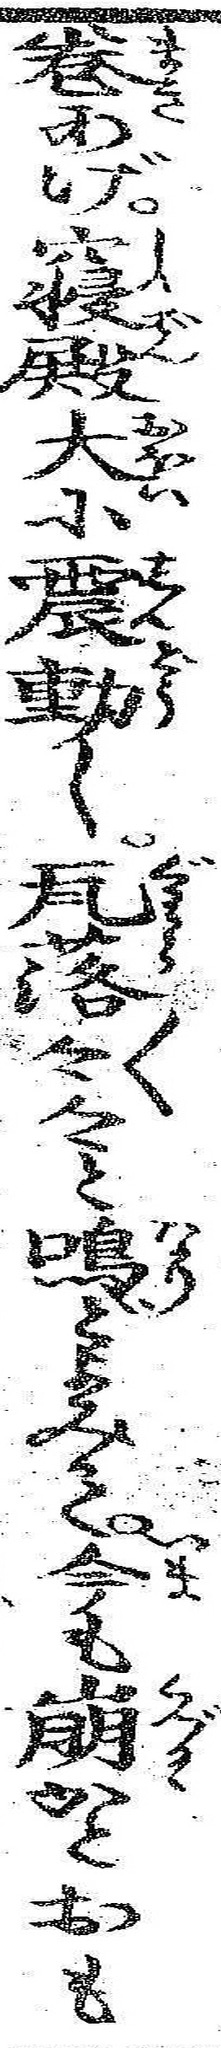巻あげ。寝殿大に震動し。瓦落々々と鳴どよみて。今も崩かとおも
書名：昔話稲妻表紙
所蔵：国文学研究資料館
